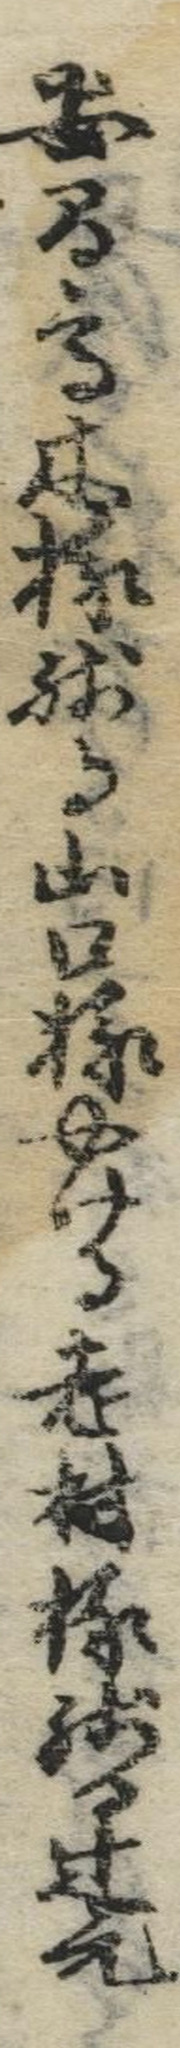安間高木様残る山口様やける志村様残る辻元
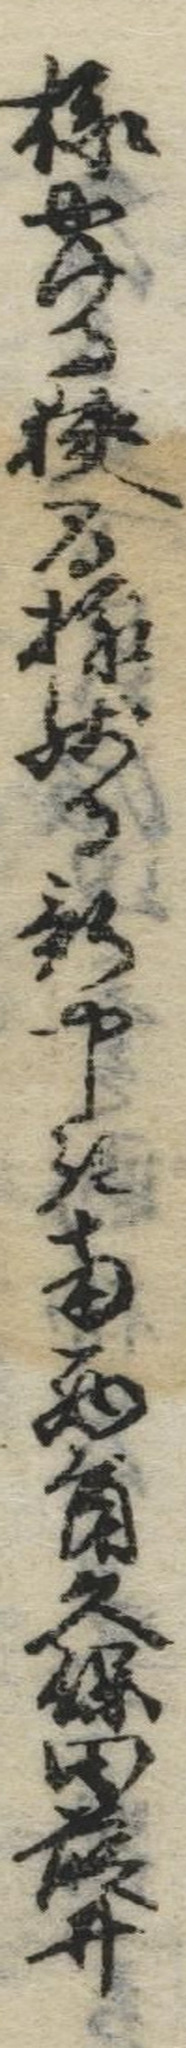様やける狭間様残る新やしき南西角久保田藤井
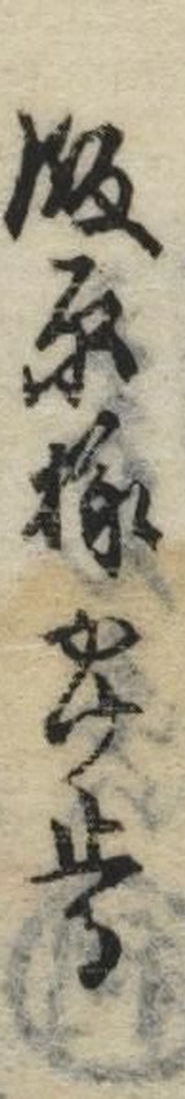飯原様やけ止る
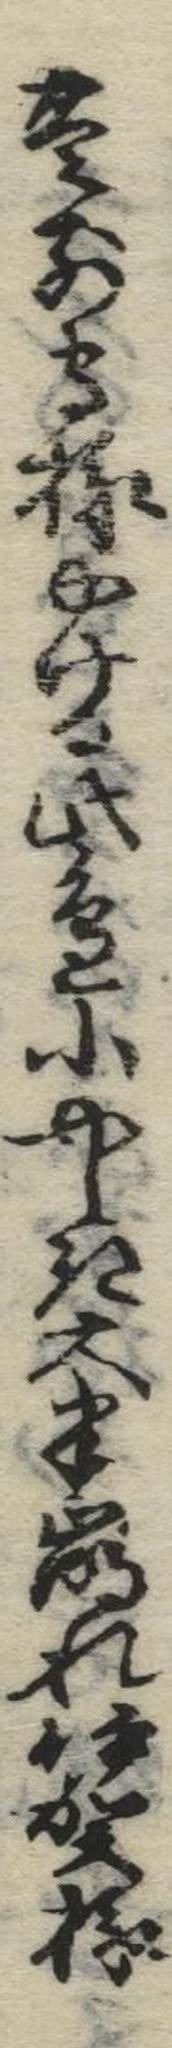豊前守様やける此辺小やしき大半崩れ伊賀様
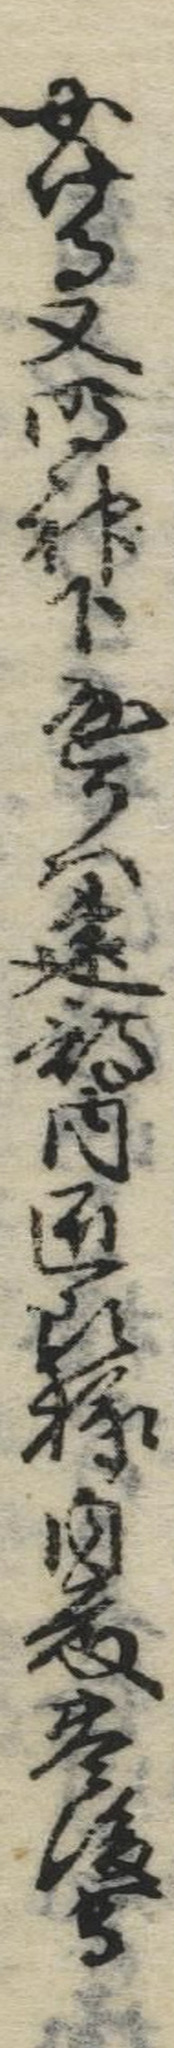やける又明神下通りハ建部内匠頭様内藤豊後守
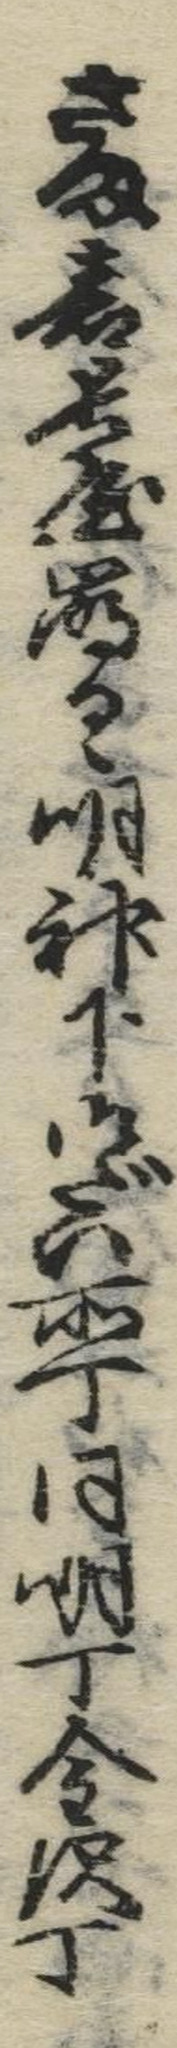さま表長屋崩るゝ明神下御だい所丁同明丁金沢丁
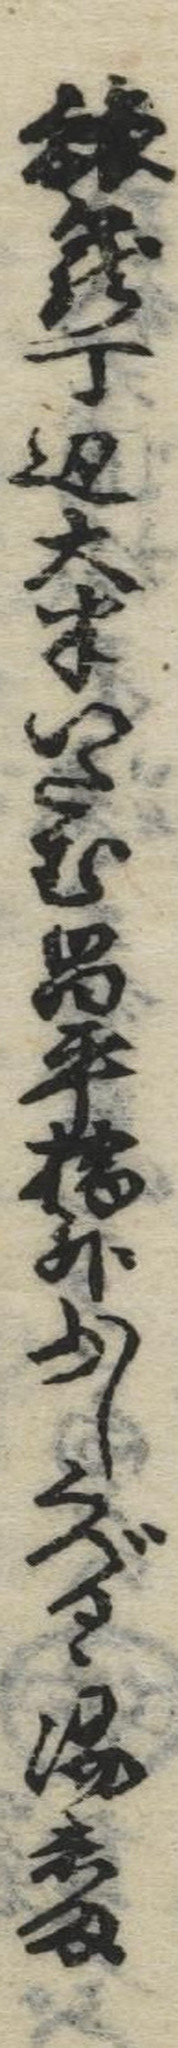旅籠丁辺大半いたむ昌平橋外少しくづるゝ湯しま
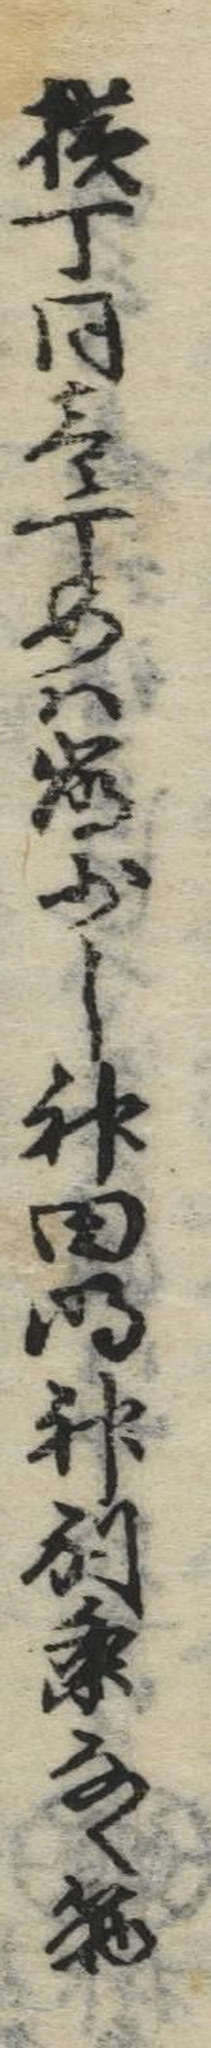横丁同壱丁めハ崩少し神田明神別条なく筋
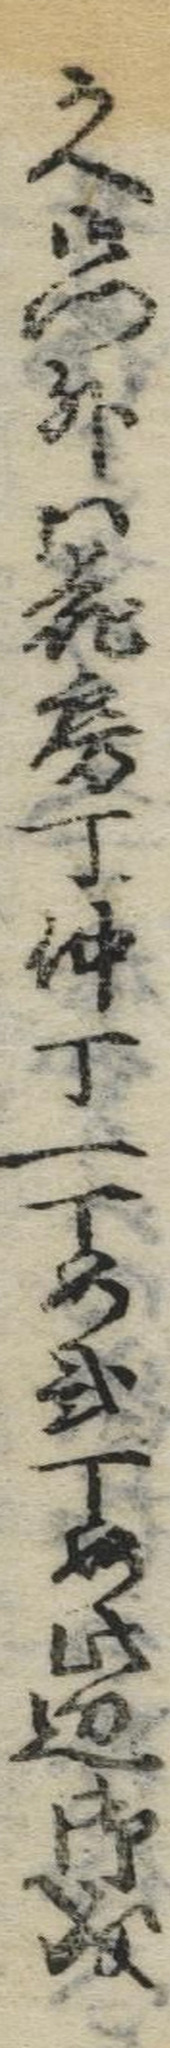かへ御門外ハ花房丁仲丁一丁め弐丁め此辺御成
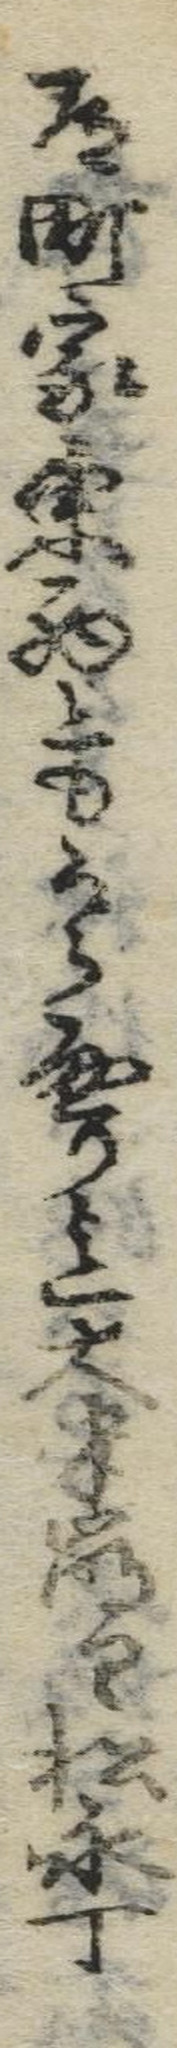道町家東西ともうら通り迄大半崩るゝ松永丁
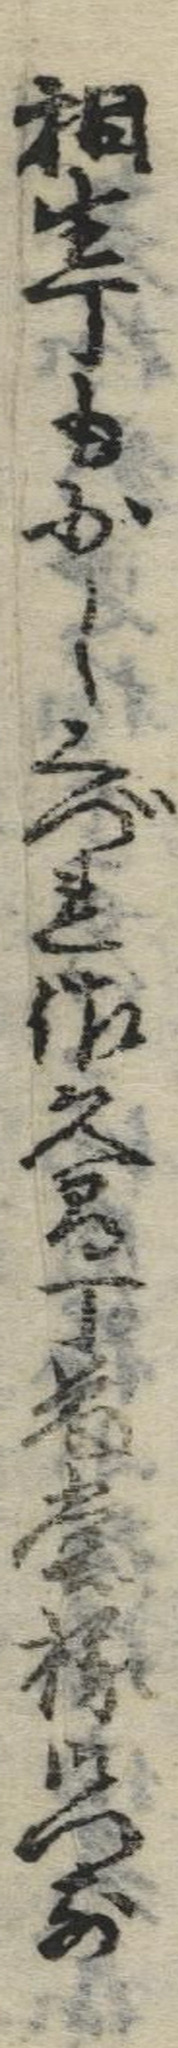相生丁も少しくづれ佐久間丁藤堂様御門前
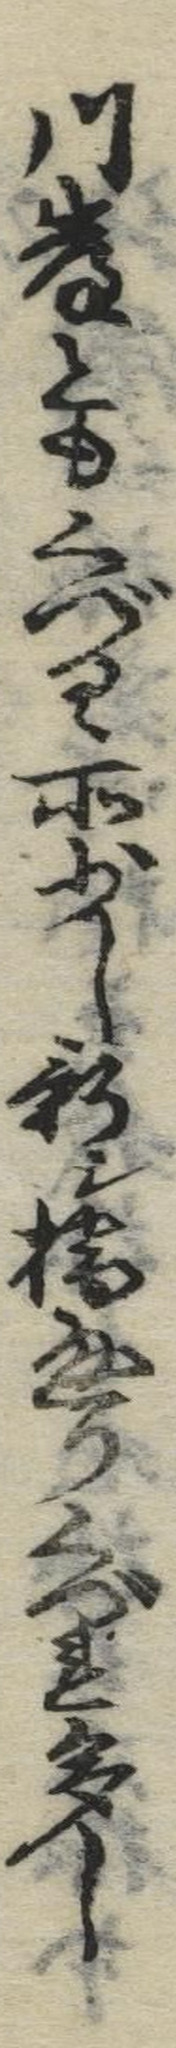川岸ともくづるゝ所少し新ㇱ橋通りくづれ多し
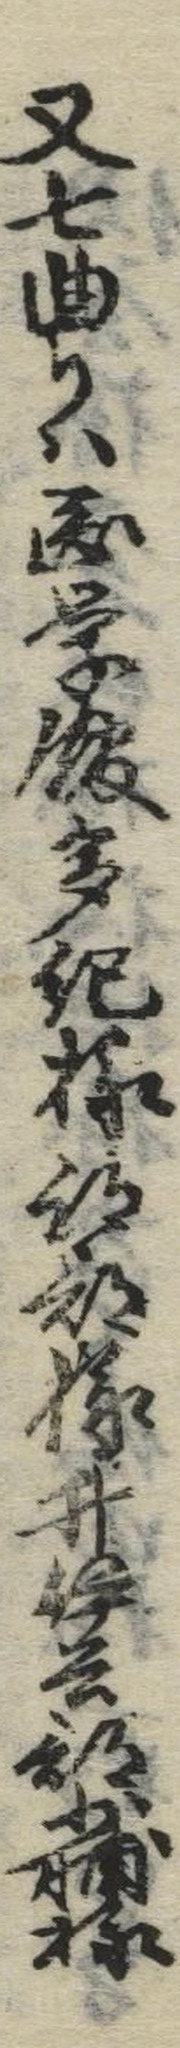又七曲りハ医学館多紀様跡部様井伊兵部少輔様
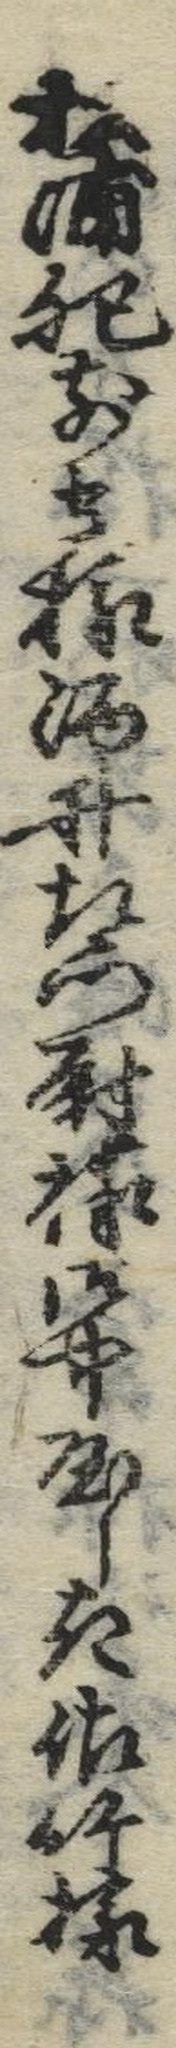松浦肥前守様酒井左衛門尉様御中やしき佐竹様
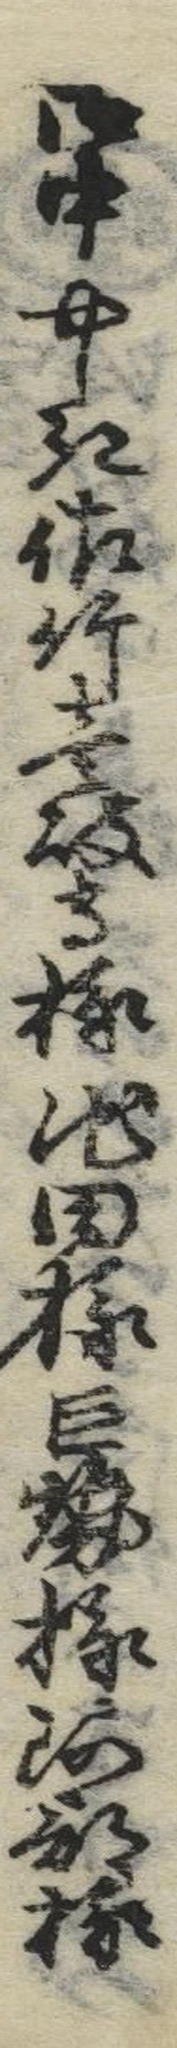御中やしき佐竹壱岐守様池田様巨勢様阿部様
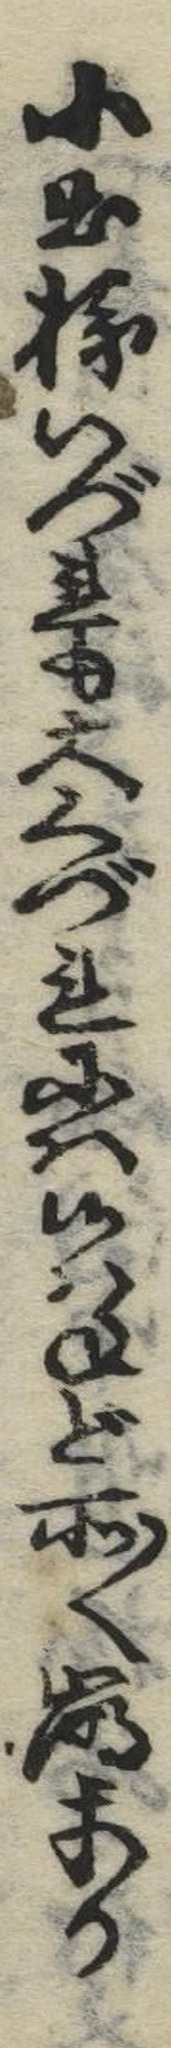小玉様いづれも大くづれにハ候ハねど所々崩あり
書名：安政二卯十月二日夜四ツ時過　御府内御屋敷方市中共　地震類焼場所明細書之寫　并街道筋近郷聞書
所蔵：東京大学地震研究所図書室 Earthquake Research Institute Library, The University of Tokyo, JAPAN
